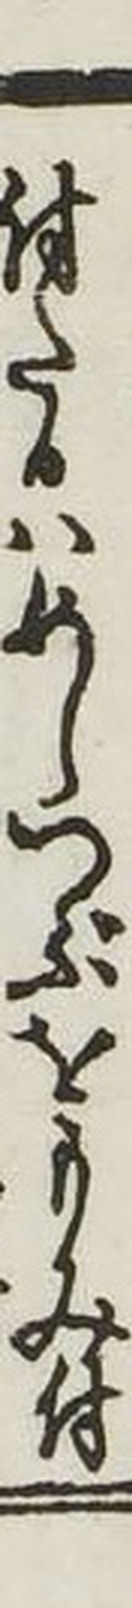付たるはめしつぶをもみ付
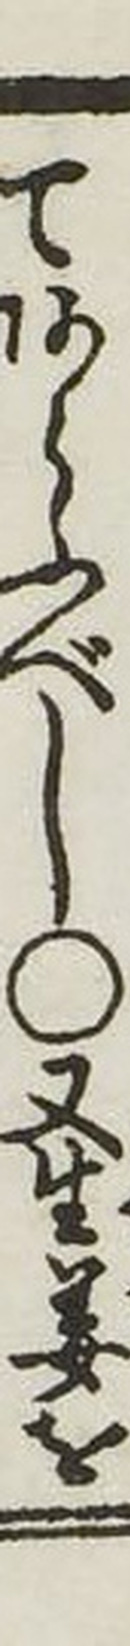てあらふべし〇又生姜を
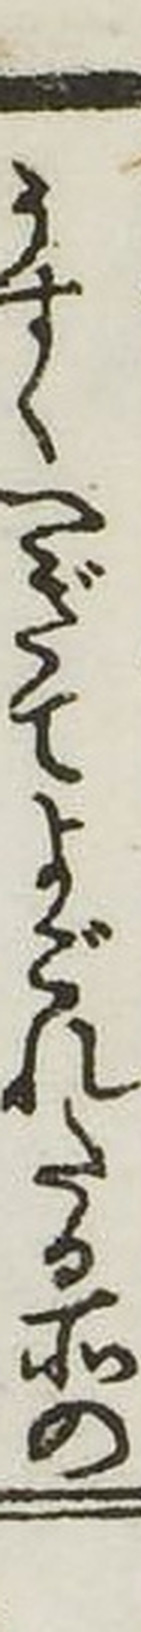うすくへぎてよごれたる所の
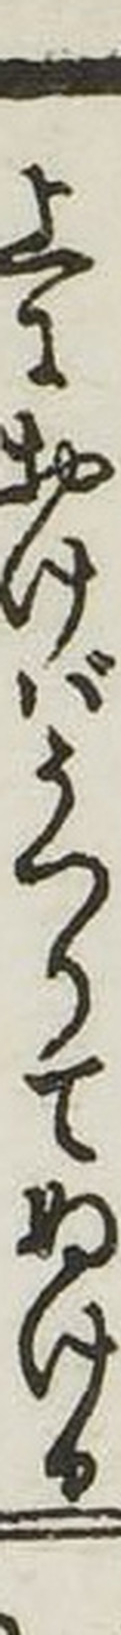上におけばうつりてぬける
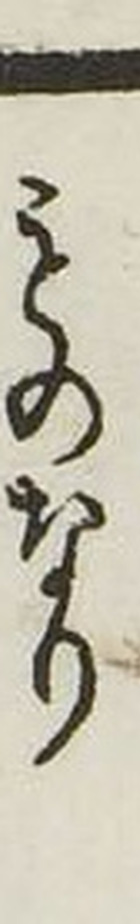ものなり
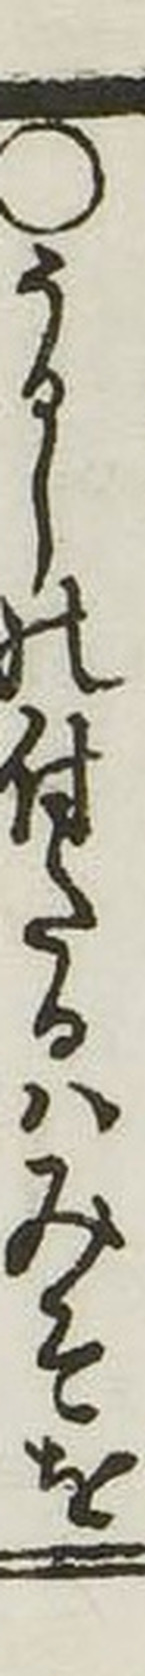〇うるしの付たるはみそを
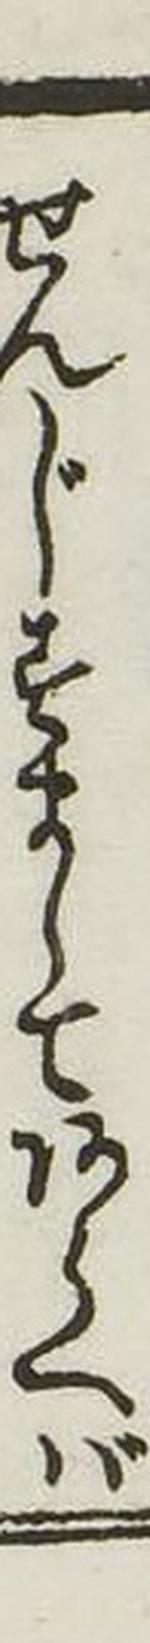せんじすましてあらへば
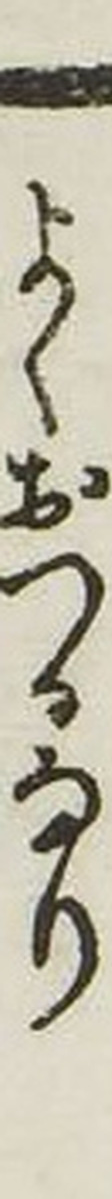よくおつるなり
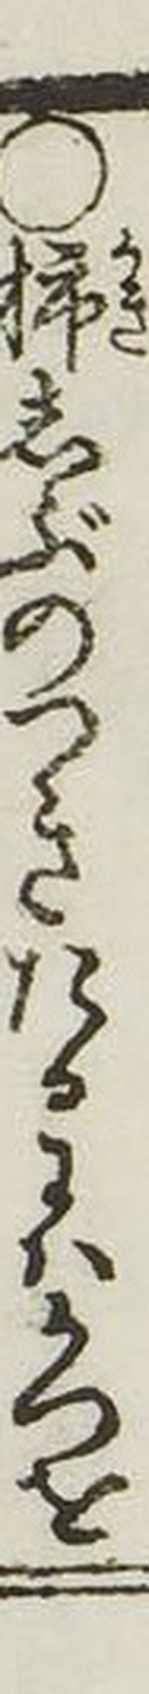〇柿しぶのつきたるにはかつを
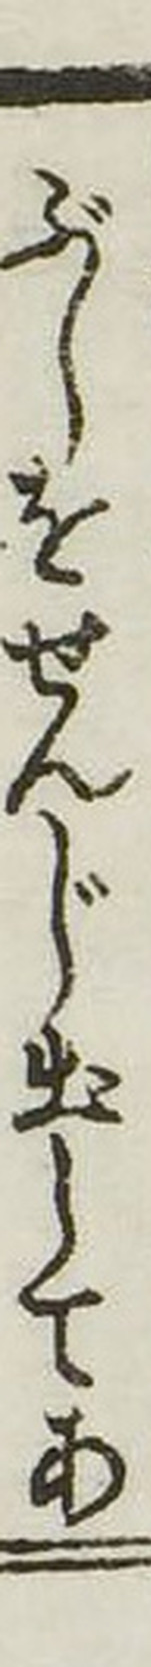ぶしをせんじ出してあ
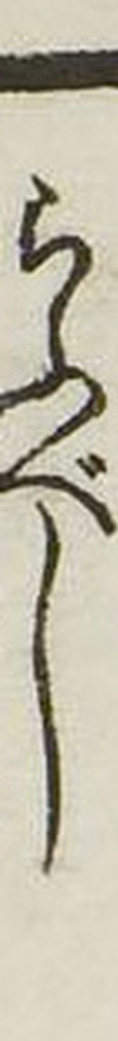らふべし
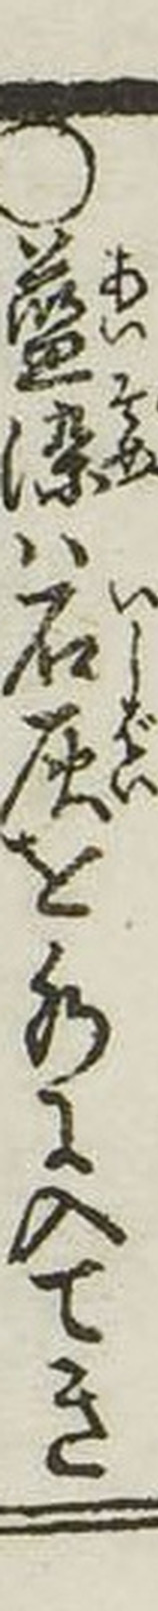〇藍染は石灰を水に入てきれ
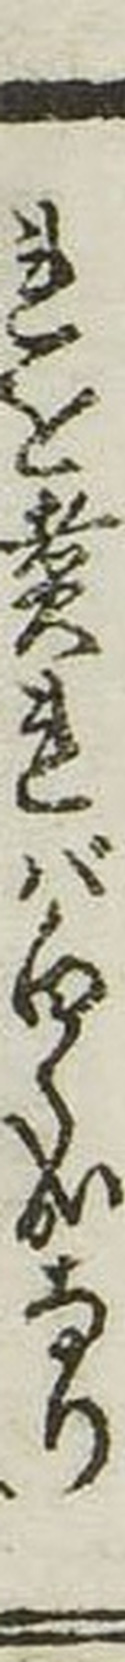れを煮れば白く成なり
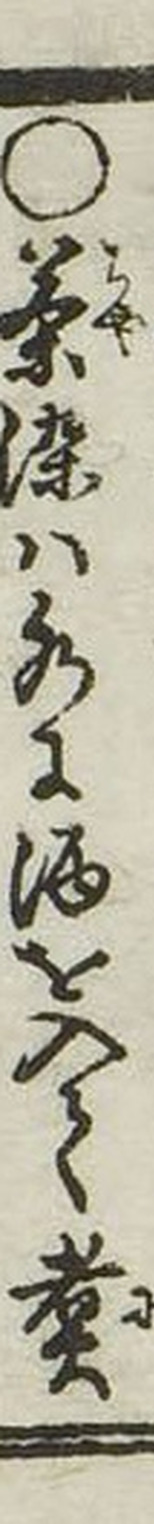〇茶染は水に酒を入て煮
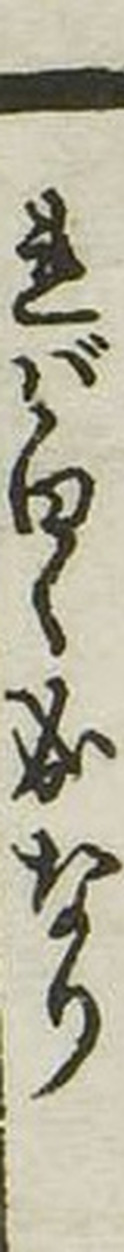れば白く成なり

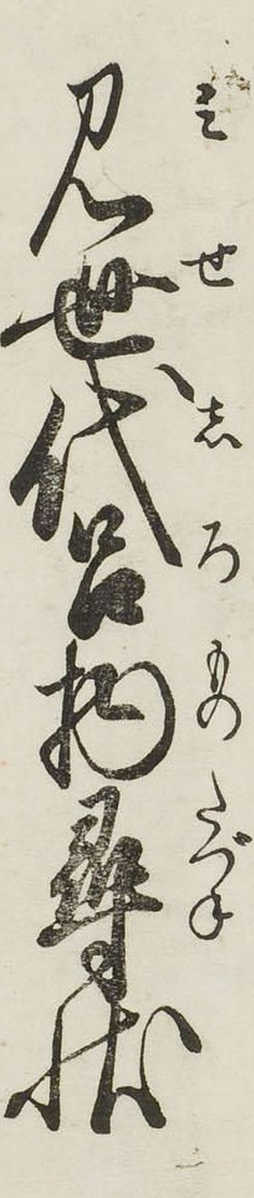見世代呂物尋状
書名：商人書翰便覧
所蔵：東京学芸大学教育コンテンツアーカイブ
